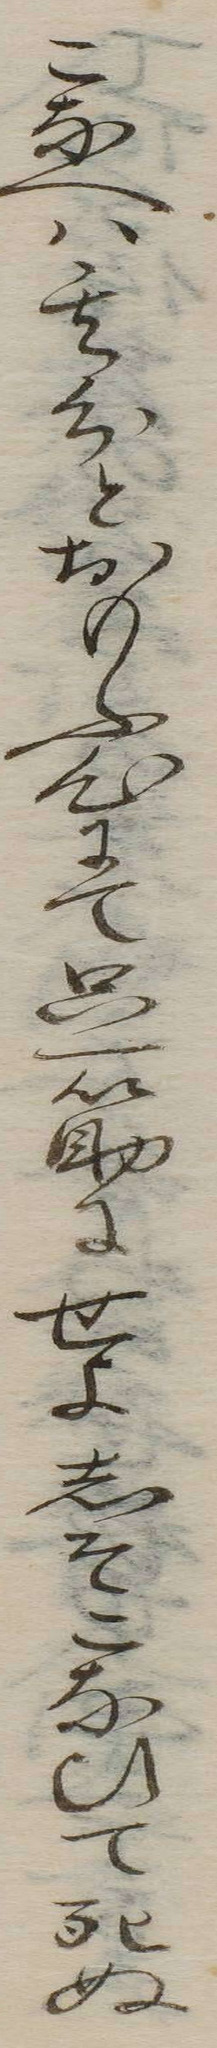こなへは其分とおもふ心にて只一筋にせよしそこなひて死ぬ
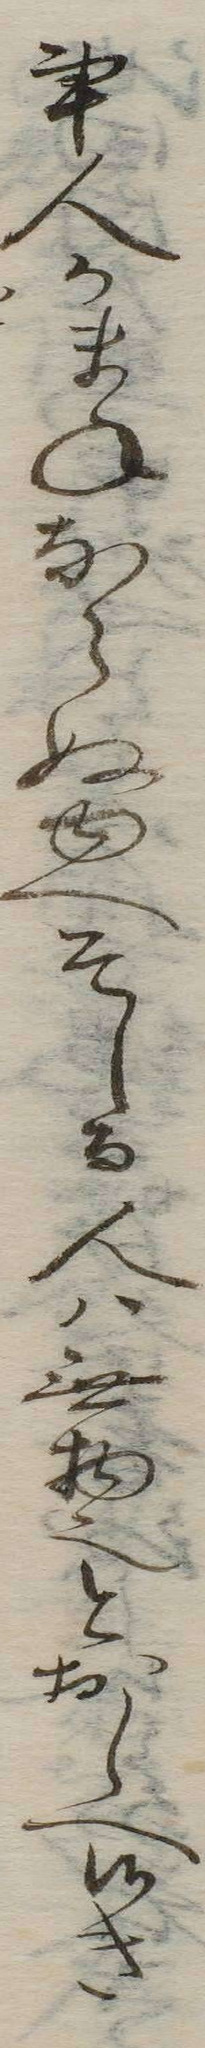事人かまねならぬゆへそしる人は無物也とおしへ候き
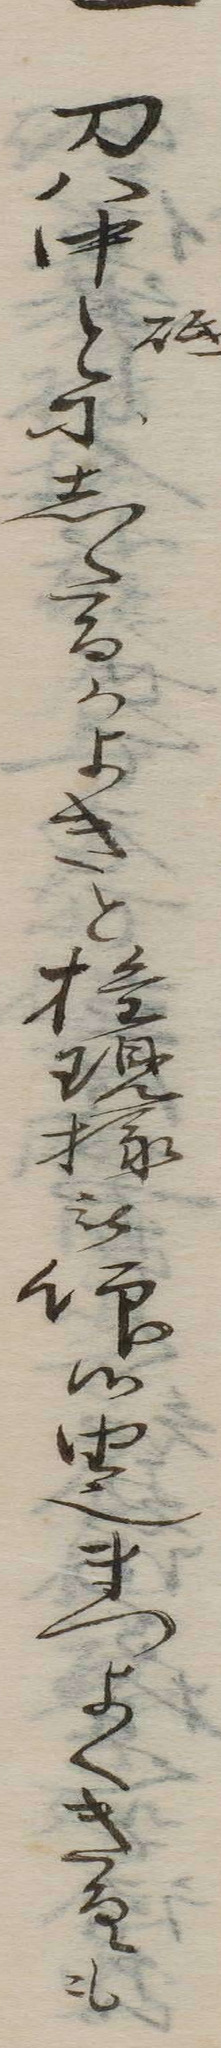一刀は中とにしたるかよきと権現様被仰候由也まつよくきるゝも
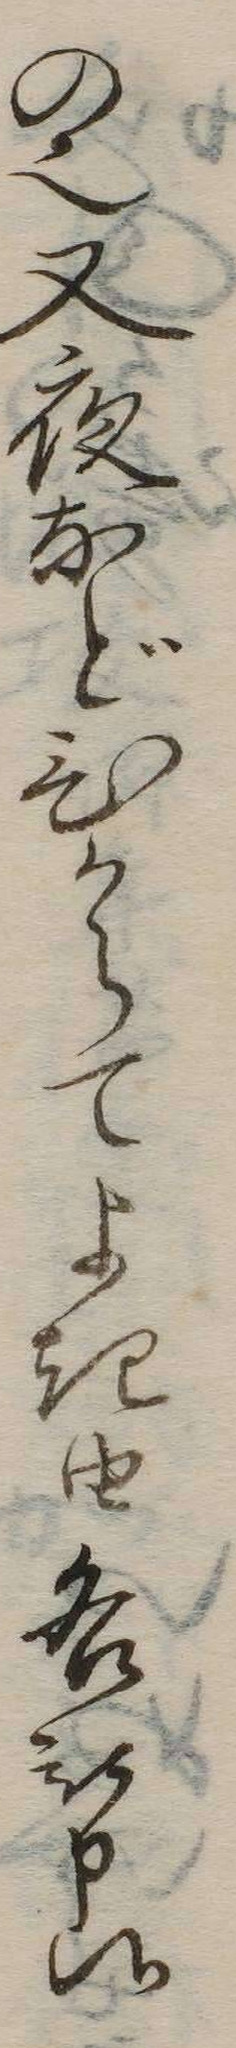の也又夜などひからてよき由各被申候
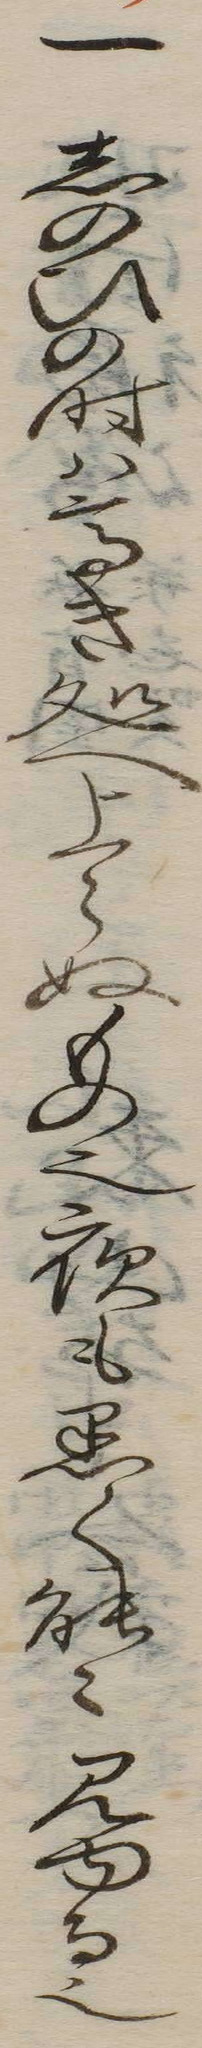一しのひの時は高き処へよらぬもの也夜も黒く能々見ゆる也
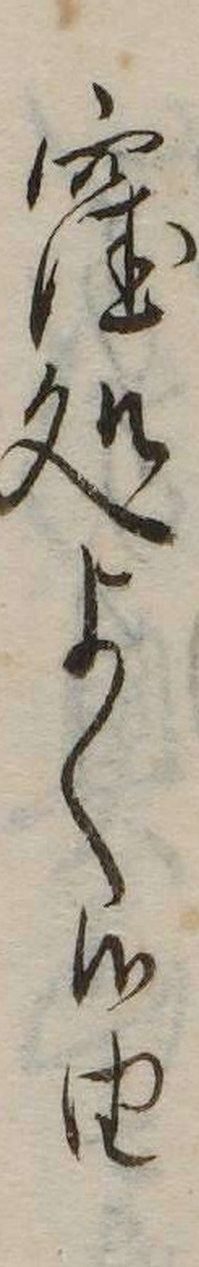窪処よく候由
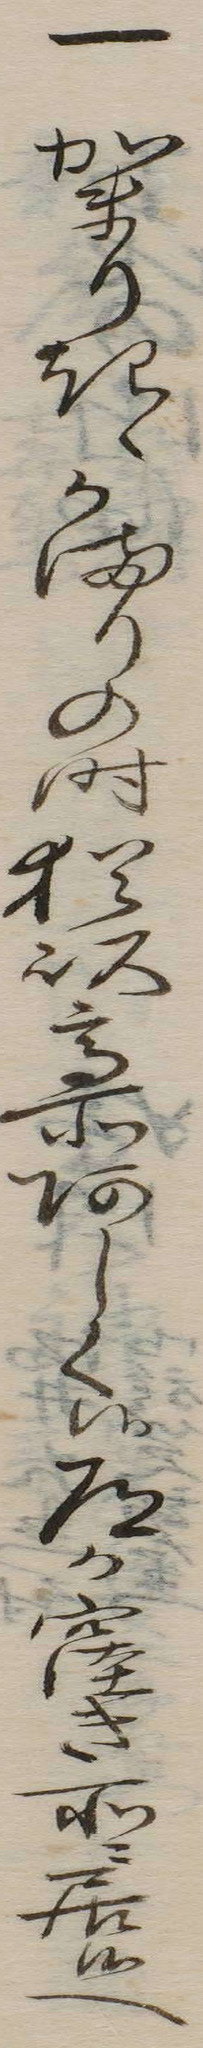一かまりきゝかまりの時猶以高所あしく候道か窪き所に居候へ
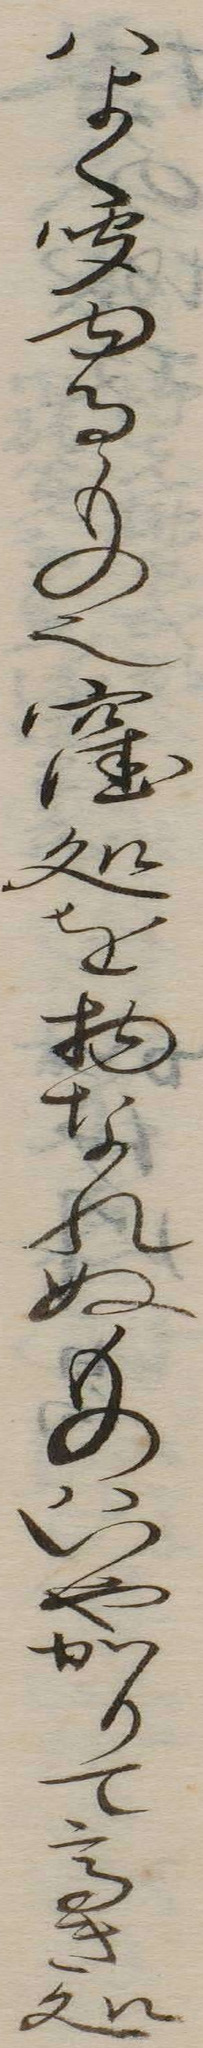はよく聞ゆるもの也窪処を物なれぬものはいやかりて高き処
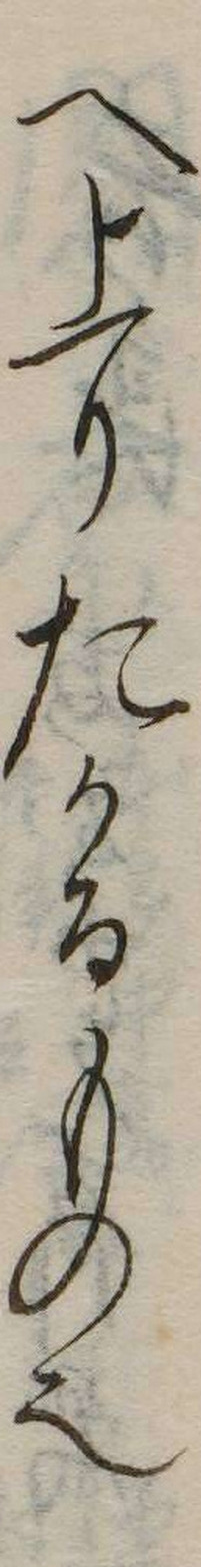へ上りたかるもの也
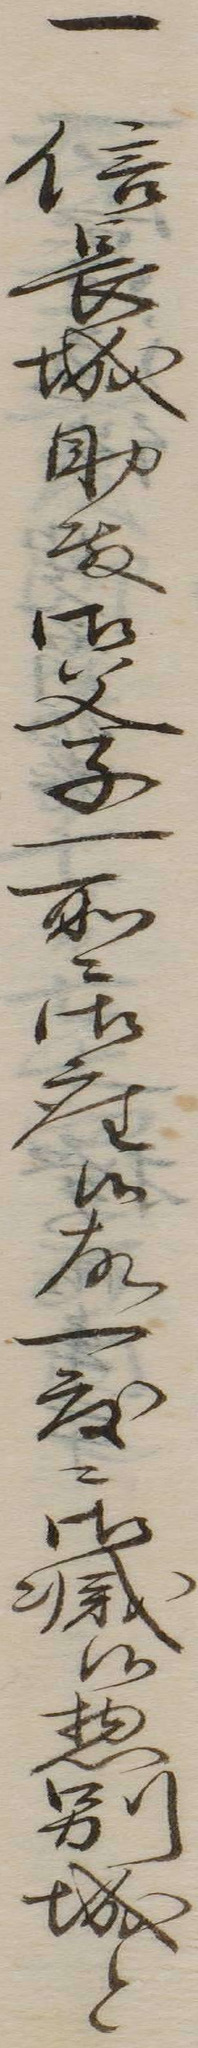一信長城助殿父子一所ニ御座候故一度ニ御滅候惣別城と
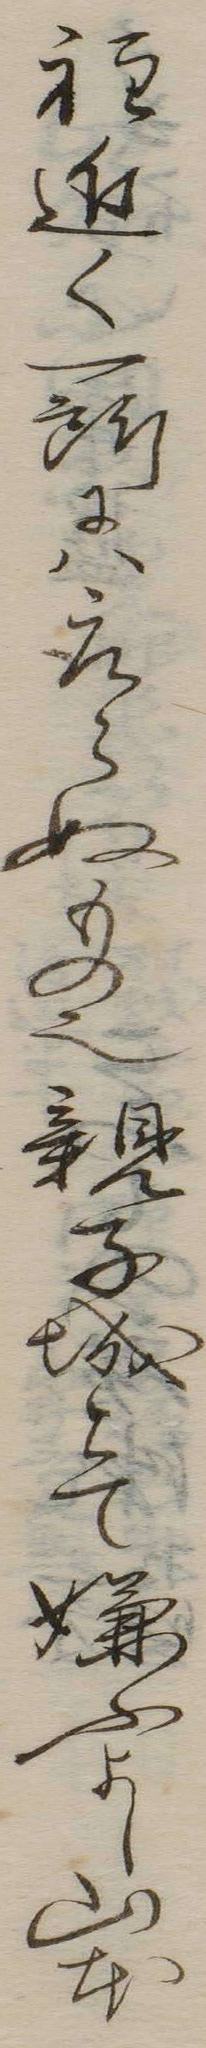程近く一所には取らぬもの也親子城とて嫌ふよし山本
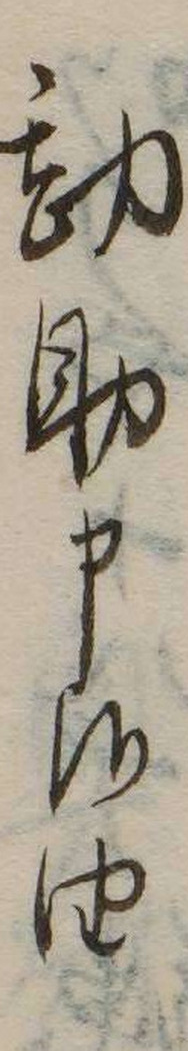勘助申候由
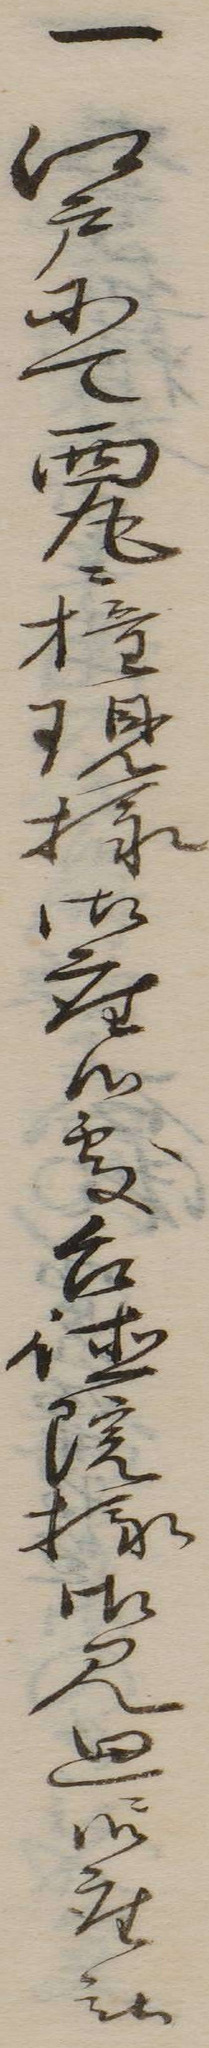一江戸にて西丸ニ権現様御座候処台徳院様御見廻ニ御座被
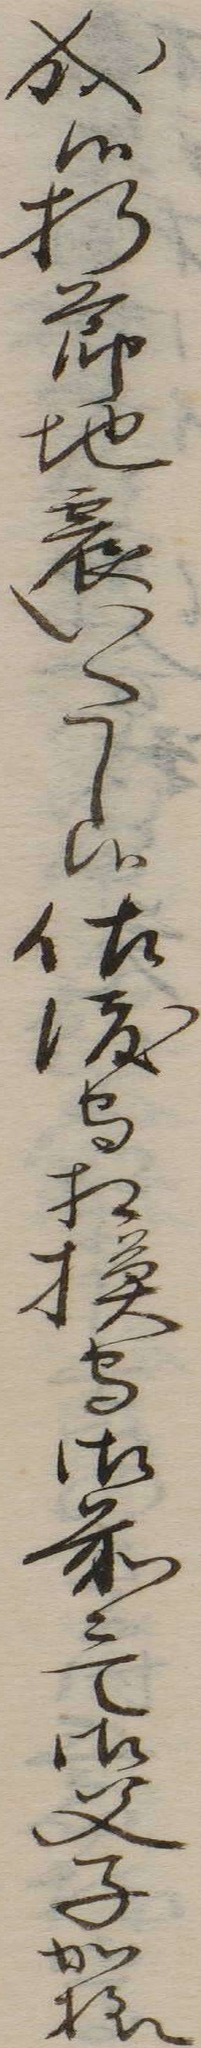成候折節地震いたし候佐渡守相模守御前ニて御父子か様
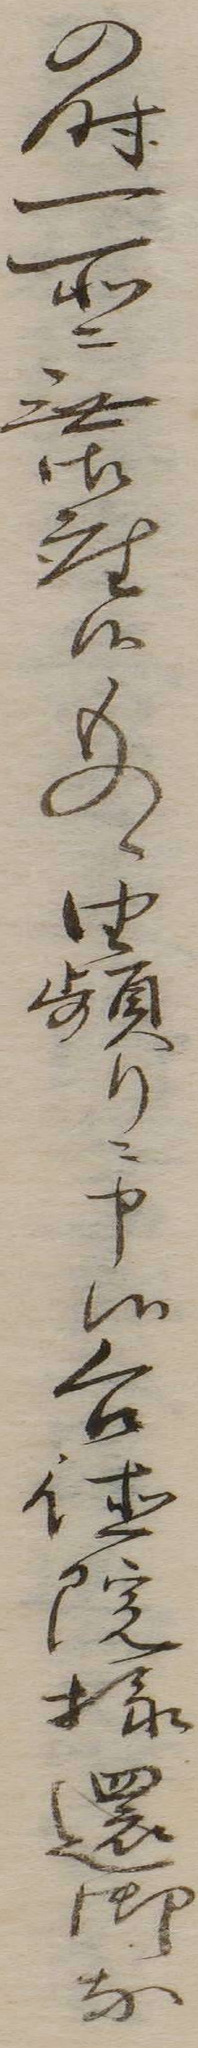の時一所ニ無御座候ものゝ由頻りニ申候台徳院様還御な

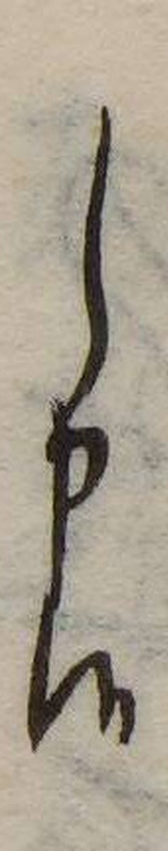し申候
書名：三河之物語
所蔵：国文学研究資料館
